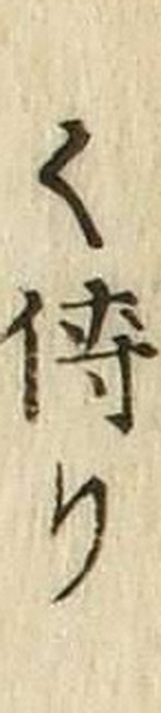く傳り
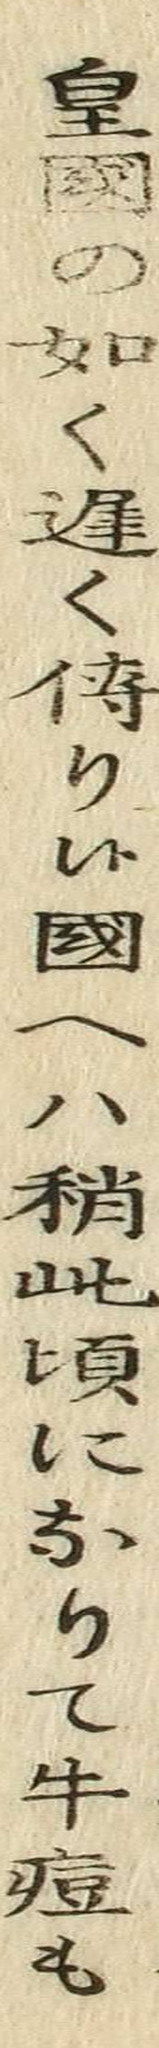皇國の如に遅く傳り候國へは稍此頃になりて牛痘
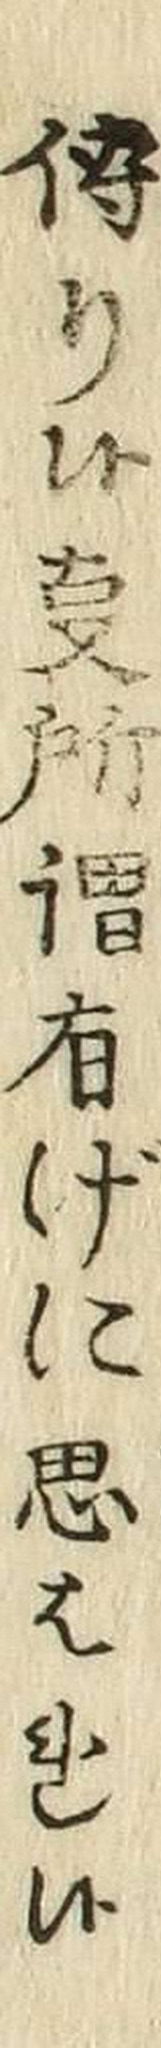傳り候㕝所謂有げに思はれ候

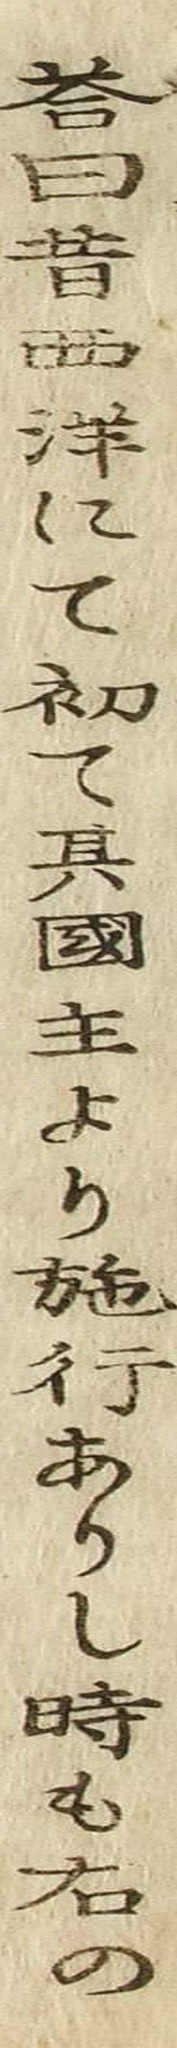答曰昔西洋にて初て其國主より施行ありし時も右の
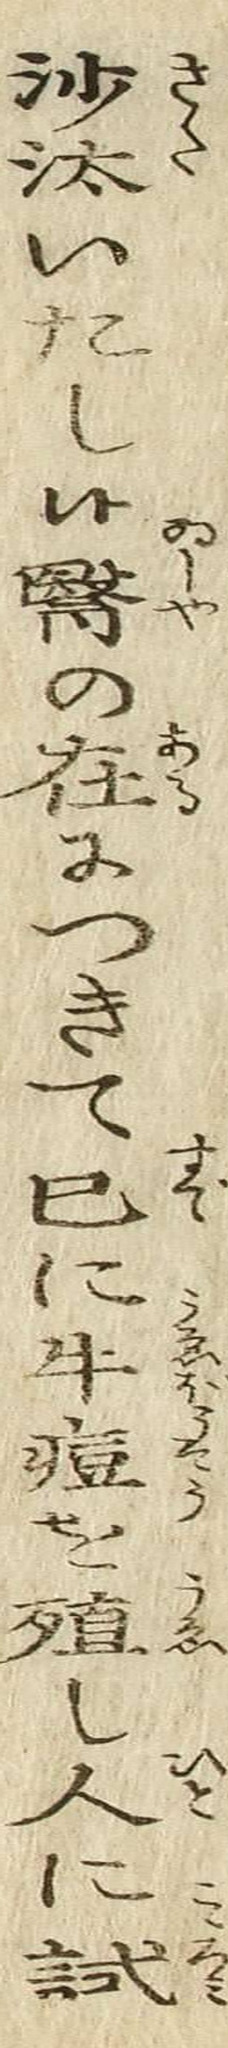沙汰いたし候醫の在につきて已に牛痘を殖し人に試
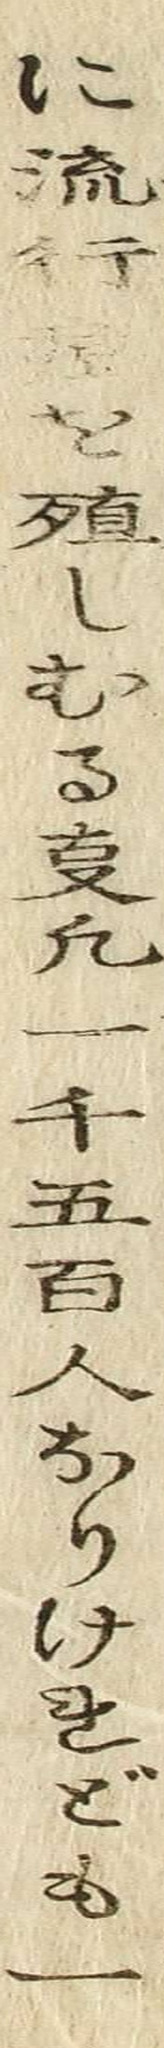に流行痘を殖しむる㕝凡一千五百人なりけれども一
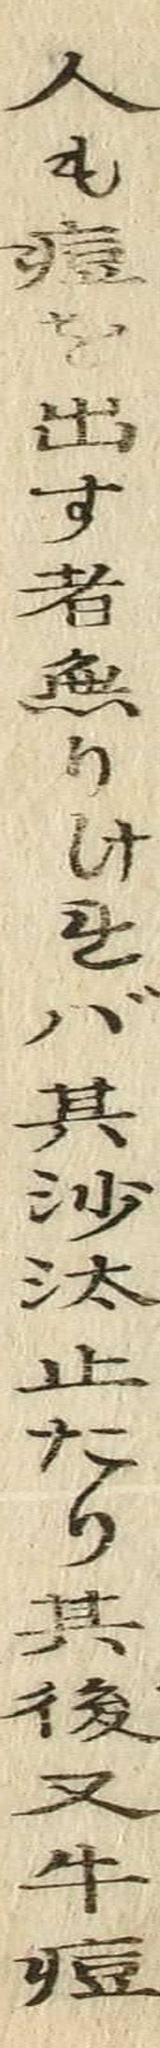人も痘を出す者無りけれバ其沙汰止たり其後又牛痘
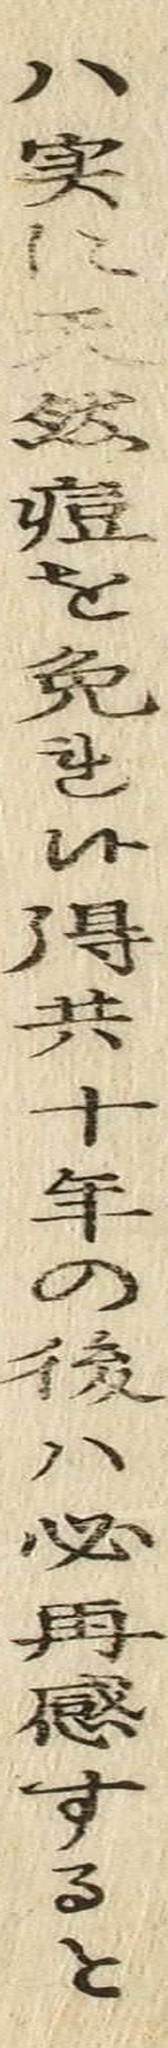ハ実に天然痘を免れ候得共十年の後ハ必再感すると
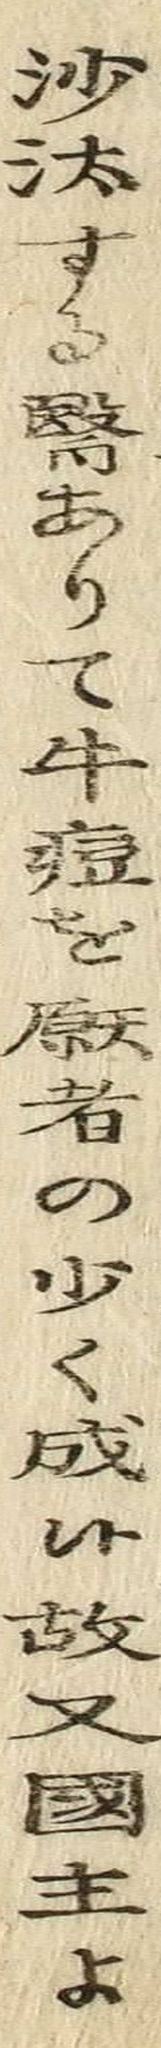沙汰する醫ありて牛痘を願者の少く成候故又國主よ
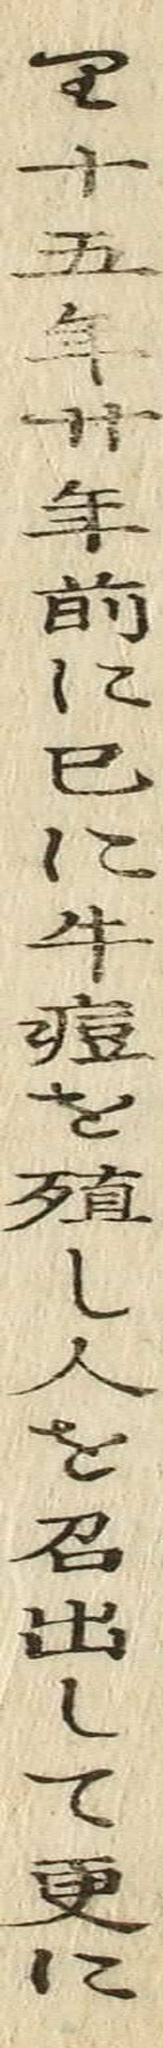り十五年廿年前に已に牛痘を殖し人を招出して更に
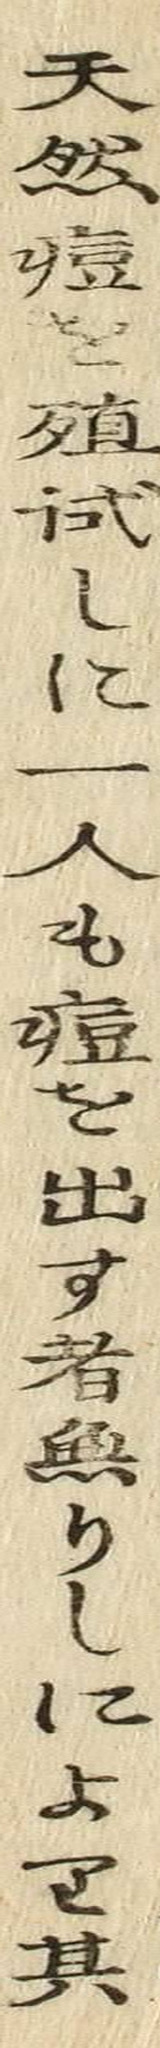天然痘を殖試しに一人も痘を出す者無りしにより其
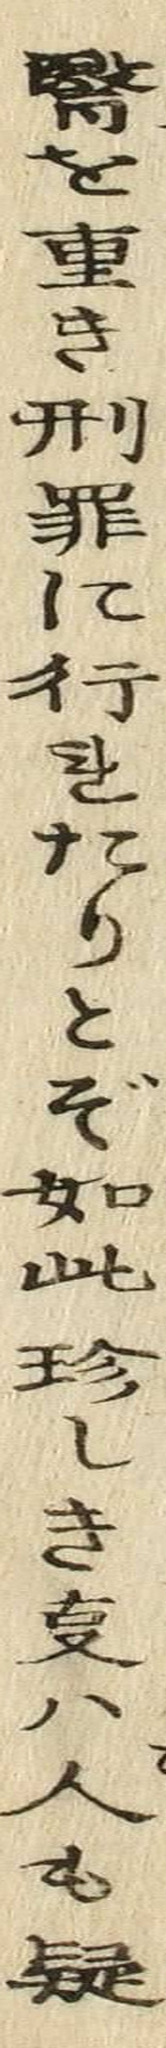醫を重き刑罪に行れたりとぞ如此珍しき㕝ハ人も疑
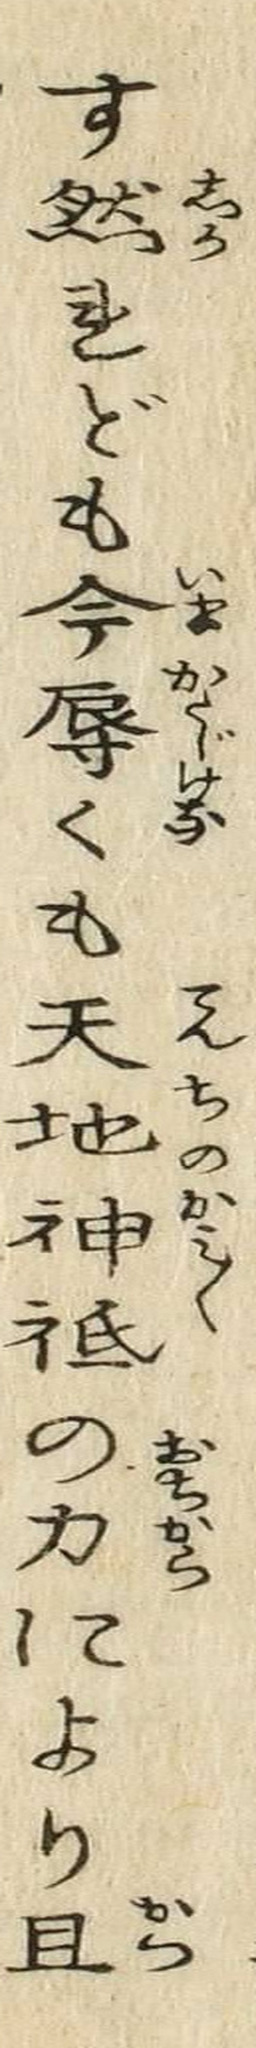す然れども今辱くも天地神袛の力により且
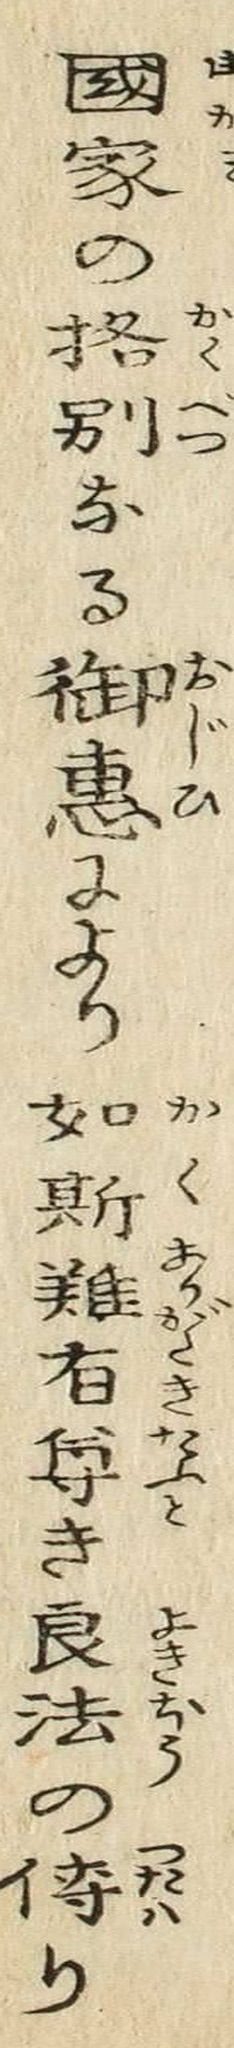國家の挌別なる恩恵により如斯難有尊き良法の傳り
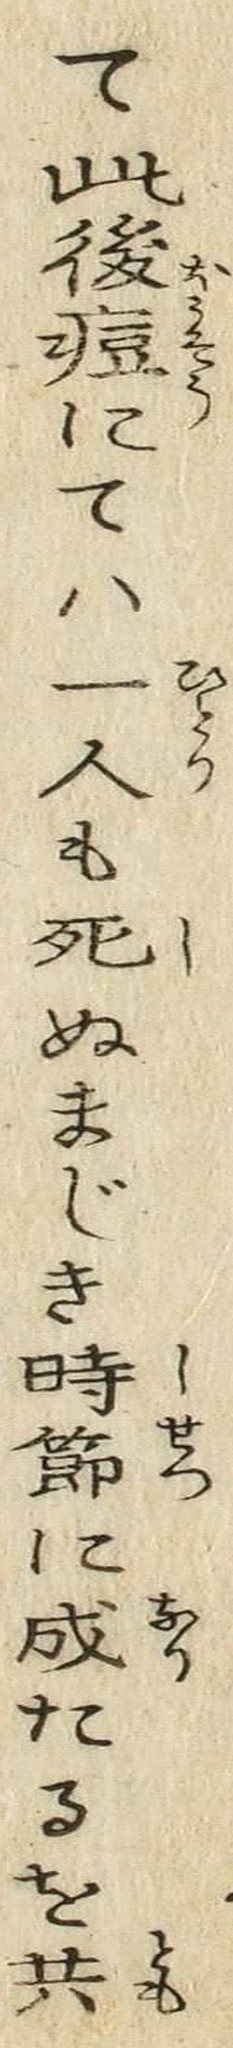て此後痘にてハ一人も死ぬまじき時節に成たるを共
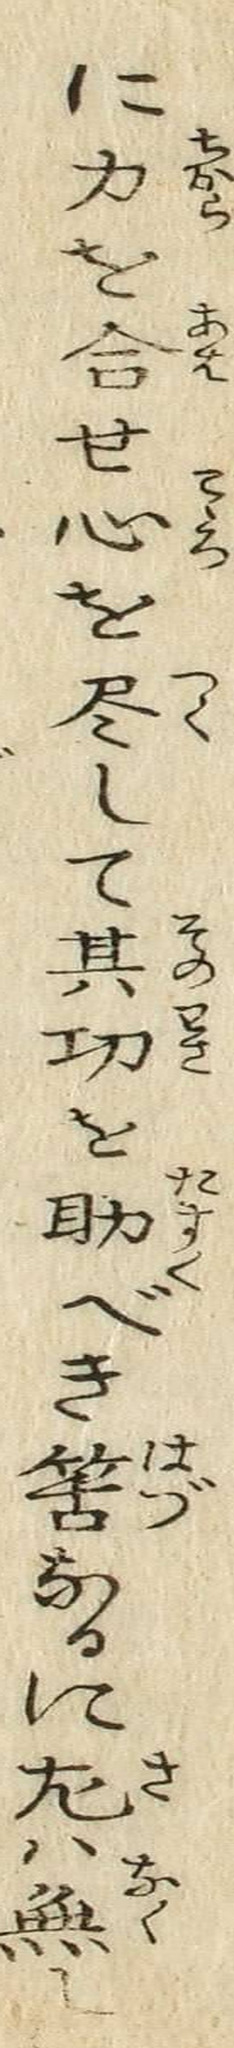に力を合せ心を尽して其功を助べき筈なるに㔫ハ無し
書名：牛痘問答
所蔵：九州大学医学図書館 国文学研究資料館
